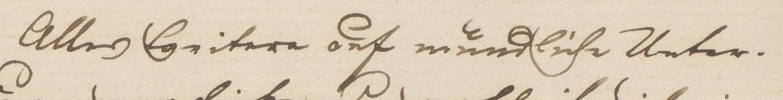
Alles weitere auf mündliche Unter-
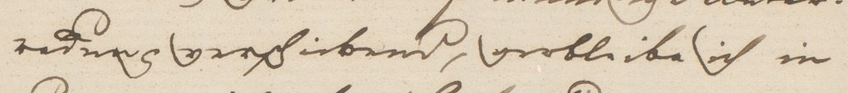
redung verschiebend, verbleibe ich in
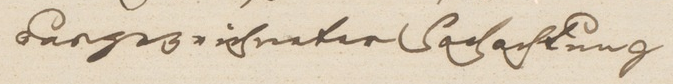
ausgezeichneter Hochachtung
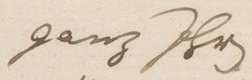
ganz Ihr
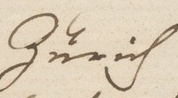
Zürich
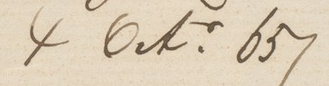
4 Octr 1865
